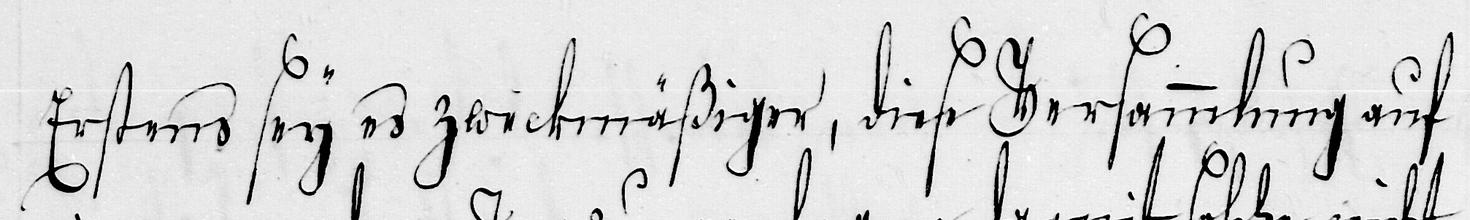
Erstens sey es zweckmäßiger, diese Versammlung auf
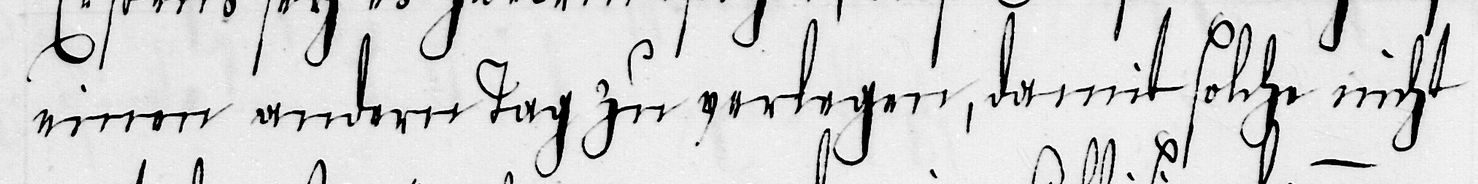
einen andern Tag zu verlegen, damit solche nicht
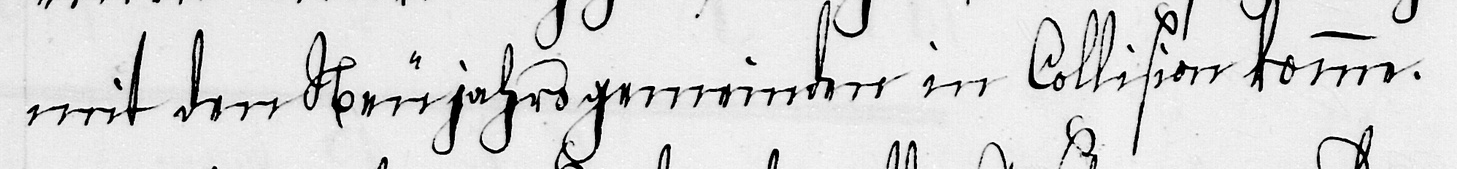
mit den Neujahrsgemeinden in Collision komme.
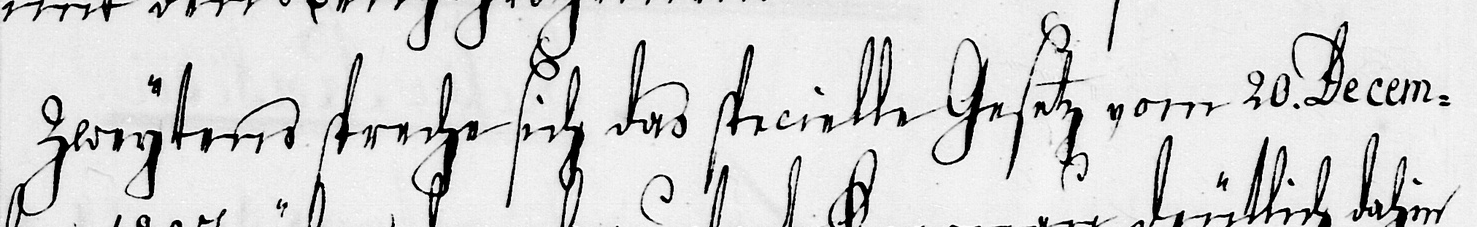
Zweytens spreche sich das specielle Gesetz vom 20. Decem¬
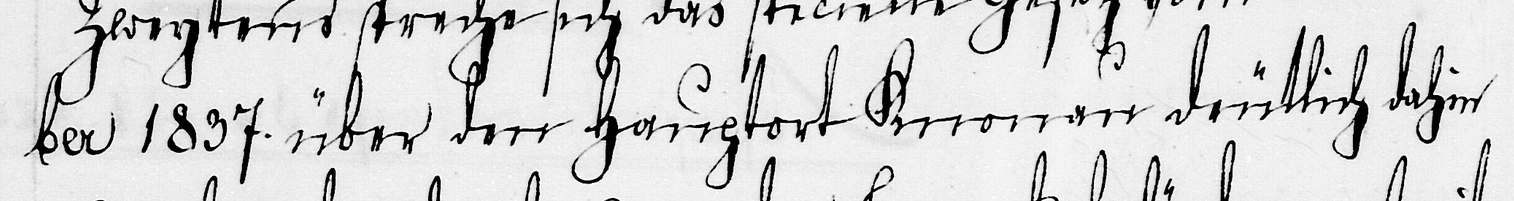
ber 1837. über den Hauptort Knonau deutlich dahin
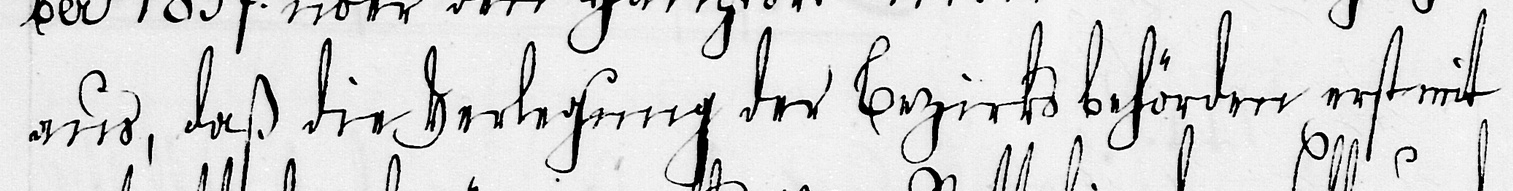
aus, daß die Verlegung der Bezirksbehörden erst mit
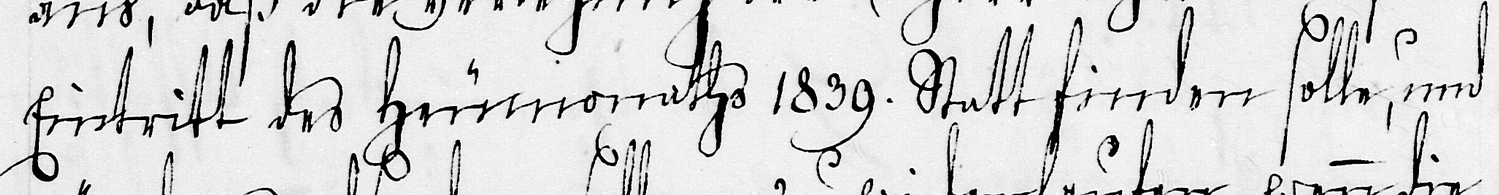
Eintritt des Heumonaths 1839. Statt finden solle, und
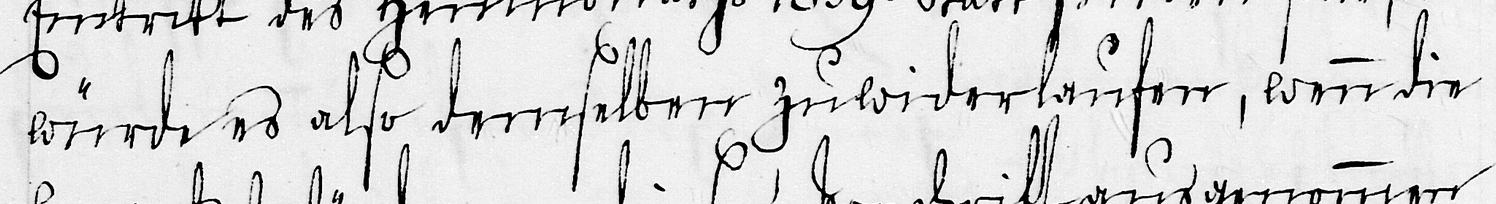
würde es also demselben zuwiderlaufen, wenn die
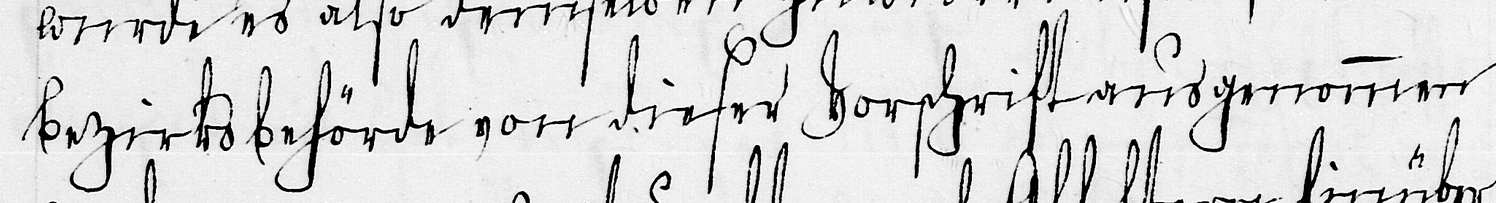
Bezirksbehörde von dieser Vorschrift ausgenommen
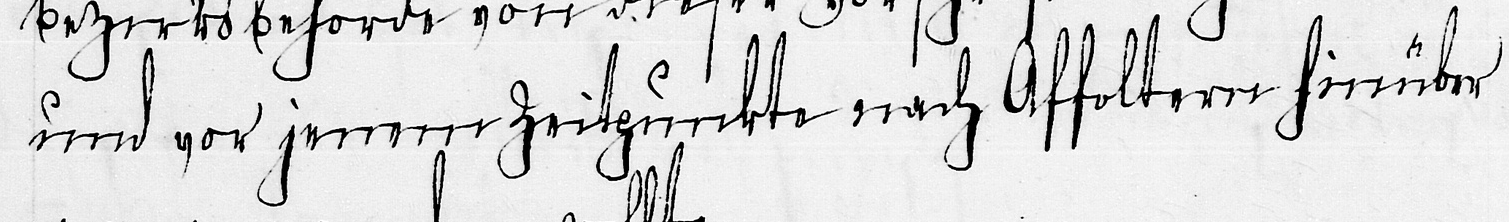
und vor jenem Zeitpunkte nach Affoltern hinüber
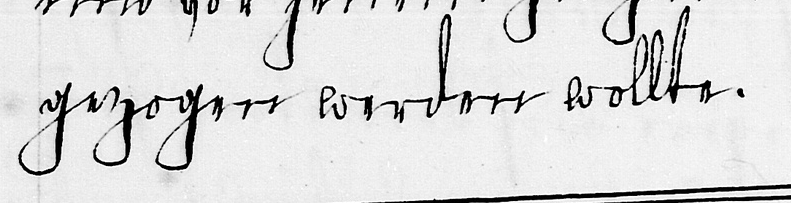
gezogen werden wollte.
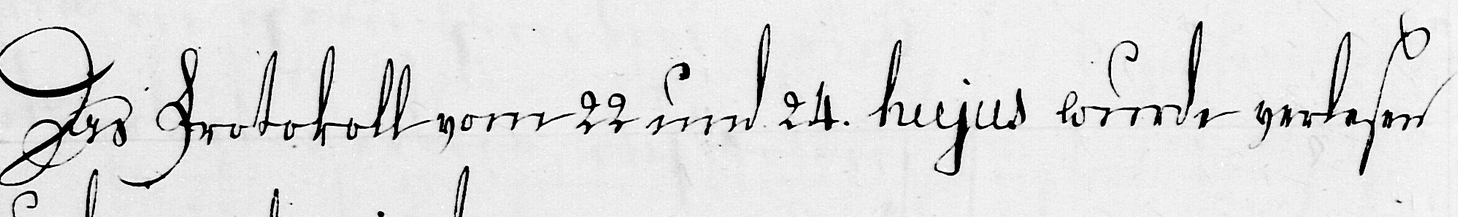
Das Protokoll vom 22 und 24. hujus wurde verlesen
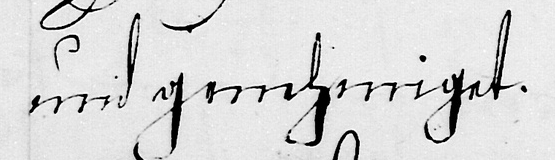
und genehmiget.
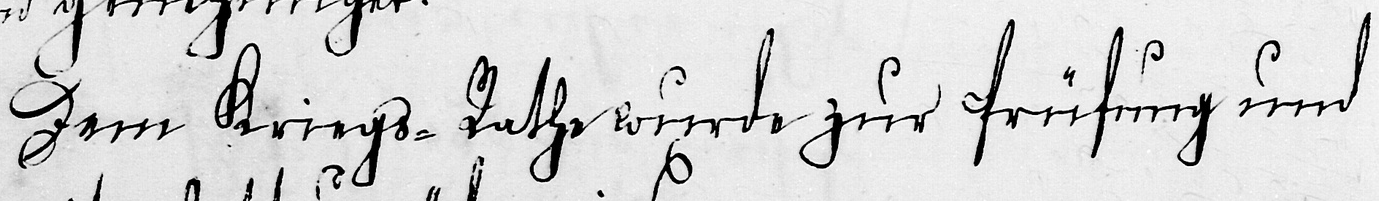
Dem Kriegs-Rathe wurde zur Prüfung und
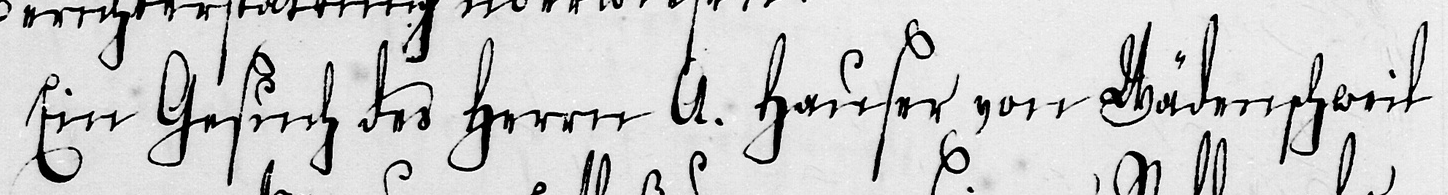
Ein Gesuch des Herrn A. Hauser von Wädenschweil
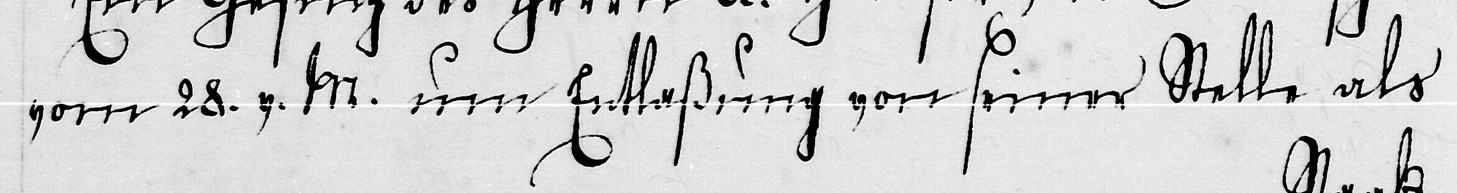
vom 28. v. M. um Entlaßung von seiner Stelle als
